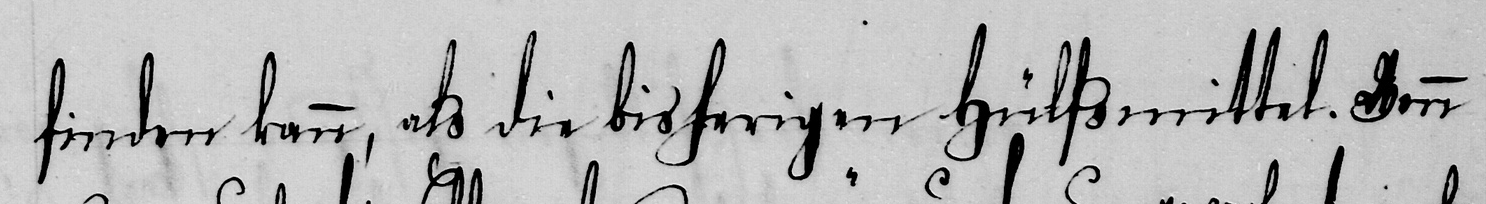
finden kann, als die bisherigen Hülfsmittel. Wenn
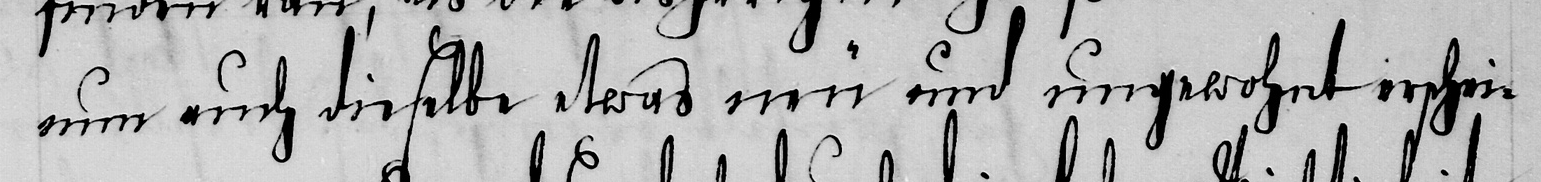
nun auch dieselbe etwas neu und ungewohnt erschei¬
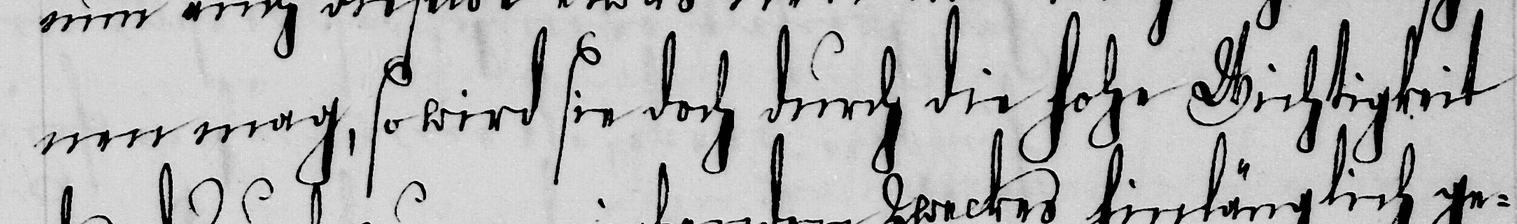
nen mag, so wird sie doch durch die hohe Wichtigkeit
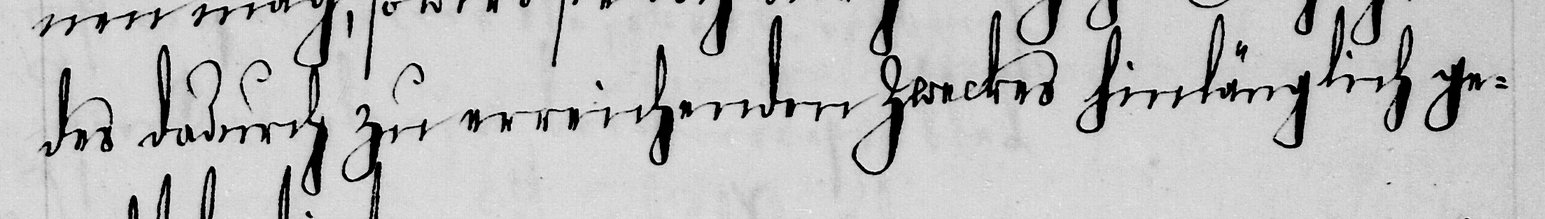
des dadurch zu erreichenden Zweckes hinlänglich ge¬
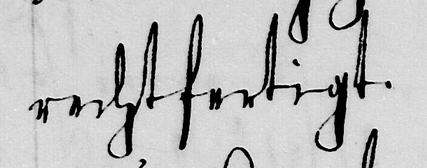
rechtfertigt.
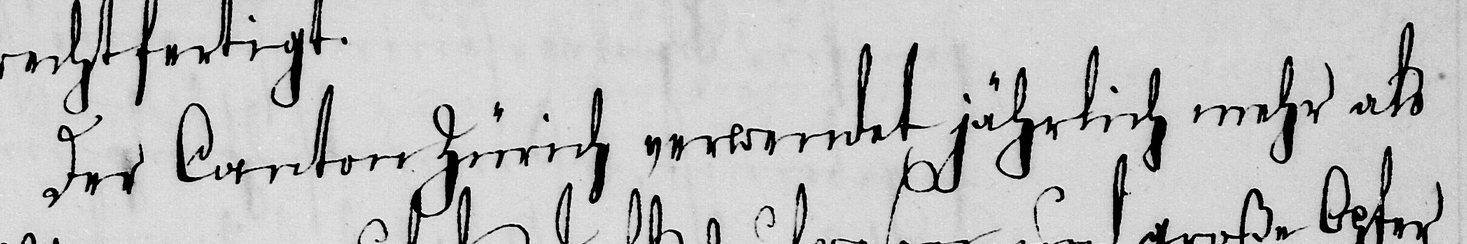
Der Canton Zürich verwendet jährlich mehr als
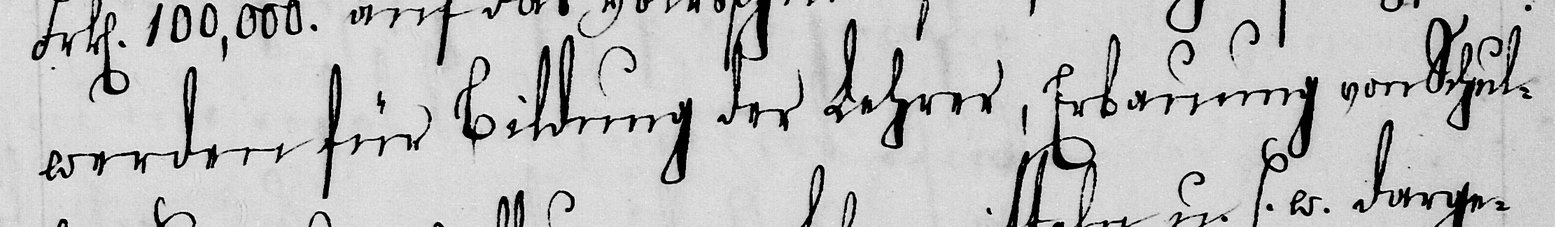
werden für Bildung der Lehrer, Erbauung von Schul¬
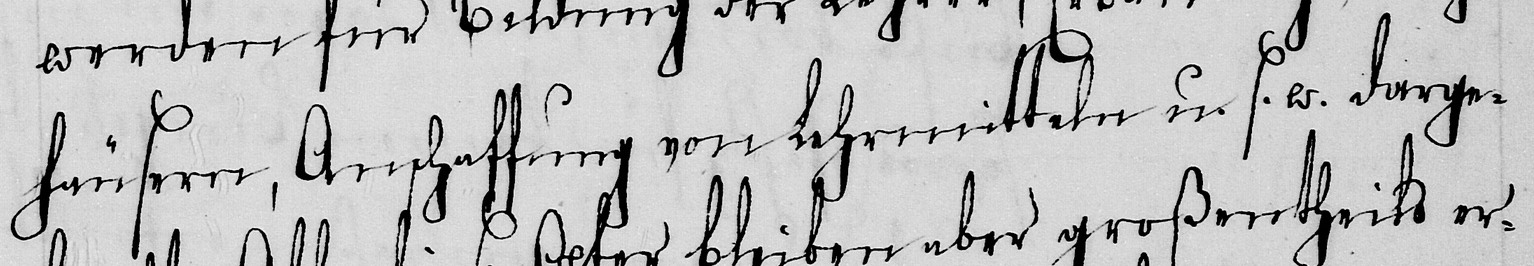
häusern, Anschaffung von Lehrmitteln u. s. w. darge¬
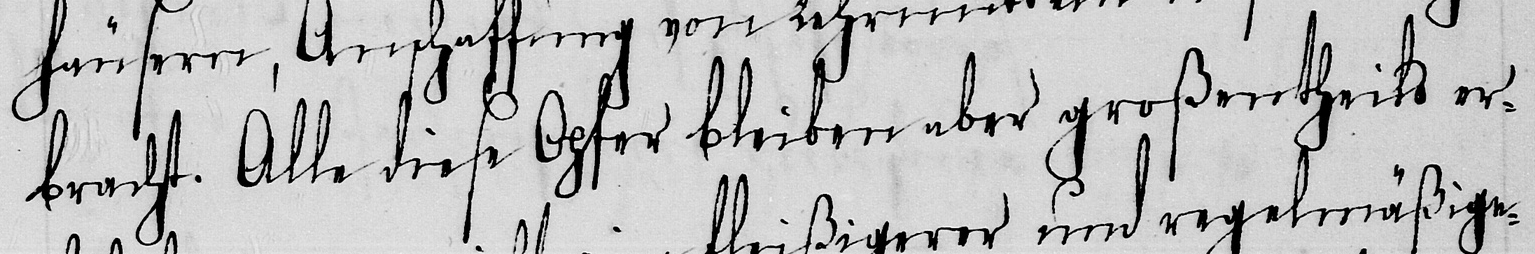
bracht. Alle diese Opfer bleiben aber großentheils er¬
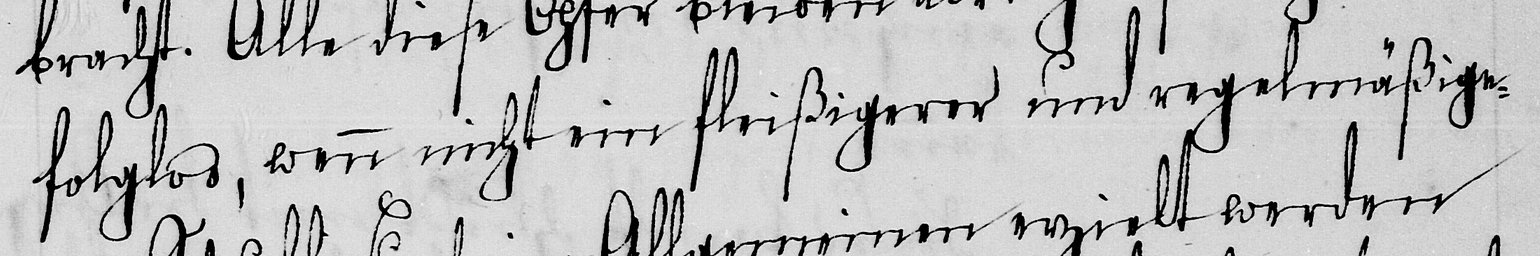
folglos, wenn nicht ein fleißigerer und regelmäßige¬
